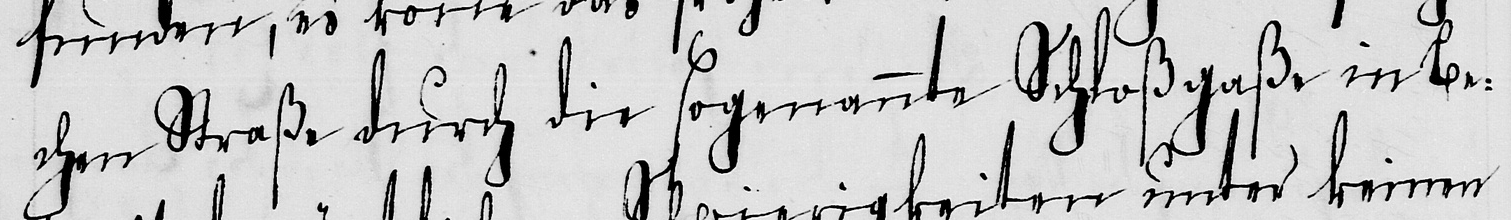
chen Straße durch die sogenannte Schloßgaße in Be¬
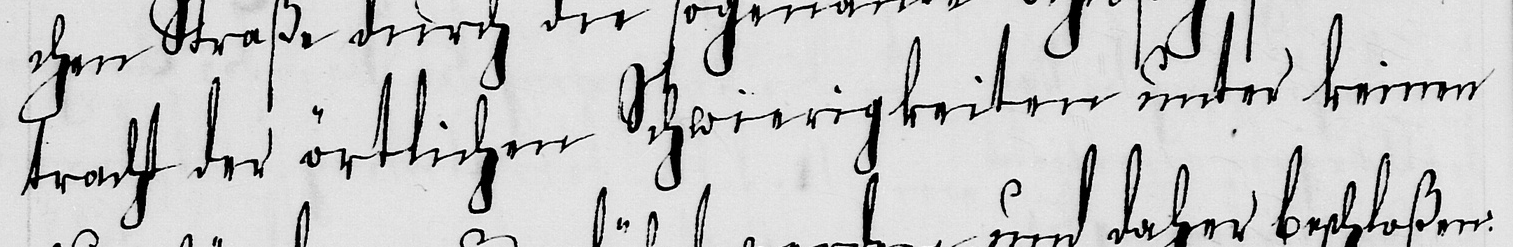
tracht der örtlichen Schwierigkeiten unter keinen
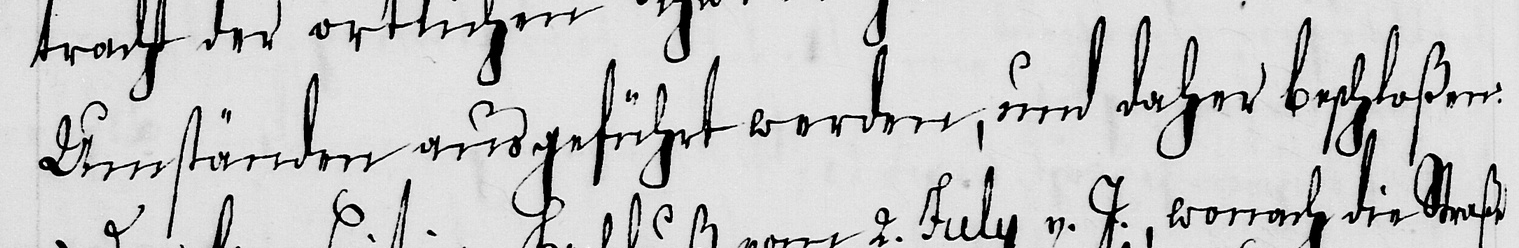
Umständen ausgeführt werden, und daher beschloßen:
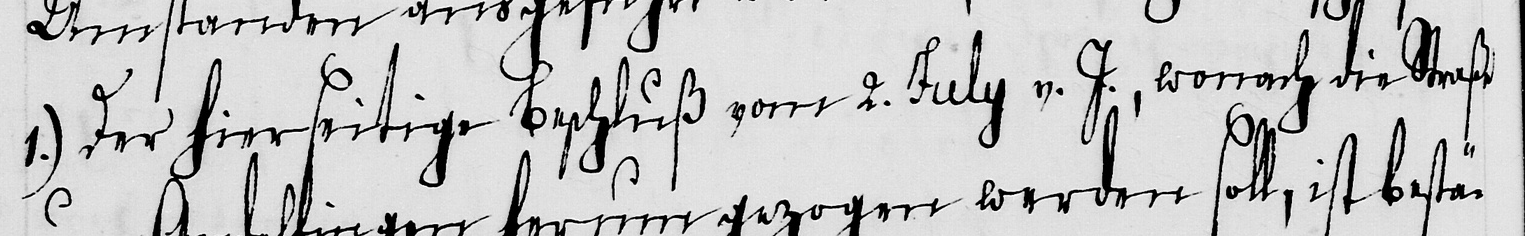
1.) Der hierseitige Beschluß vom 2. July v. J., wonach die Straße
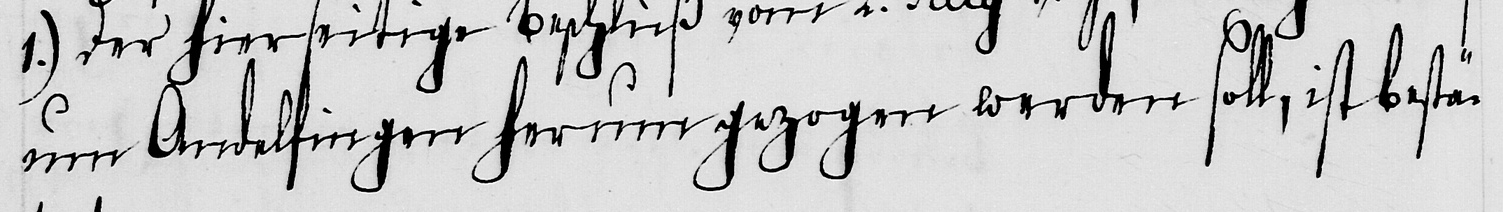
um Andelfingen herum gezogen werden soll, ist best¬
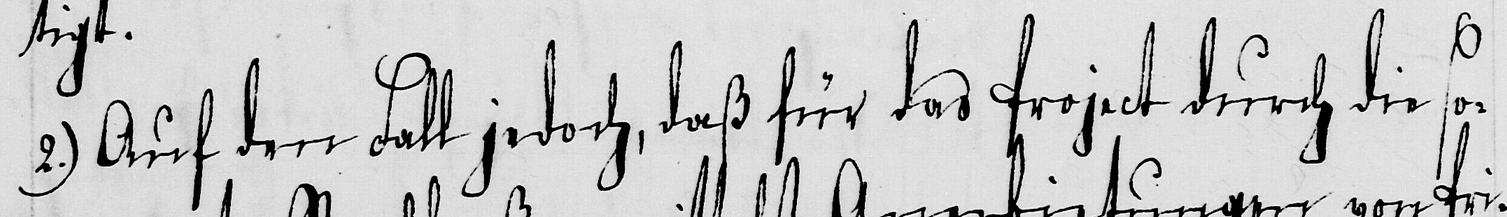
2.) Auf den Fall jedoch, daß für das Project durch die s¬
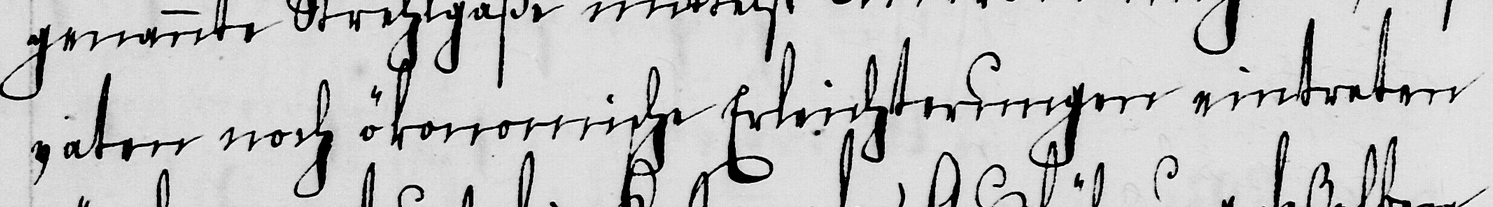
vaten noch ökonomische Erleichterungen eintreten
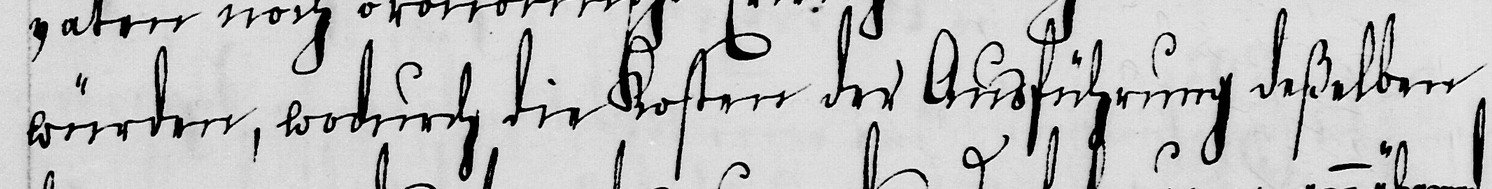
würden, wodurch die Kosten der Ausführung deßelben
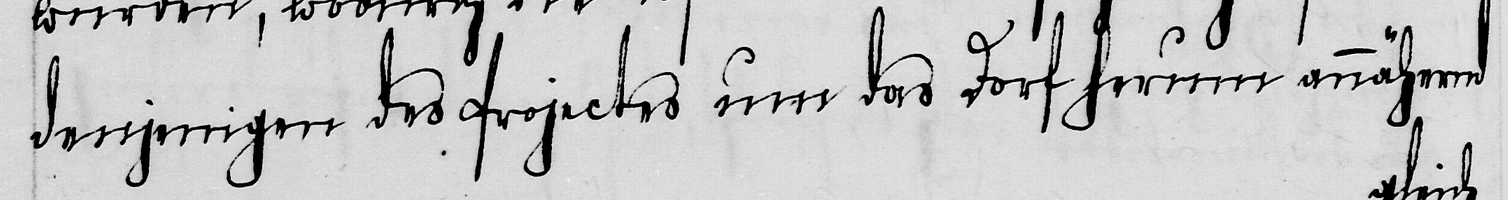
denjenigen des Projectes um das Dorf herum annähernd
